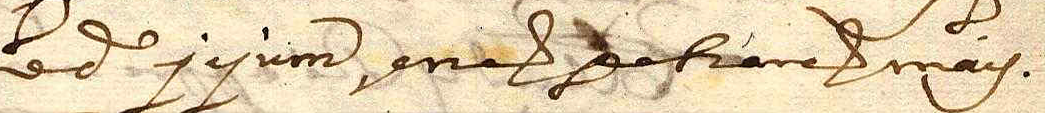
o do jejum, e naõ passaraõ mais.
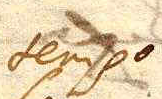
tempo
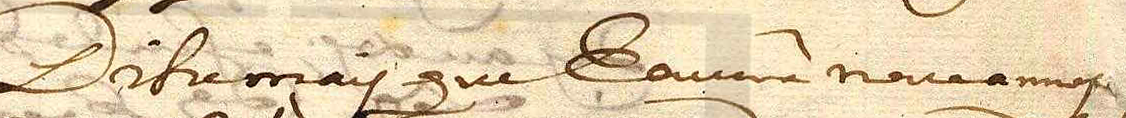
Disse mais que hauerà noue annos
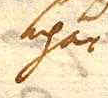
lugar
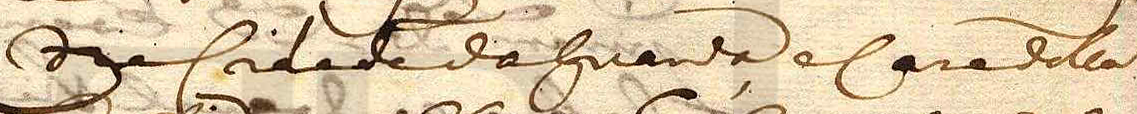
na Cidade da Guarda, e Caza della
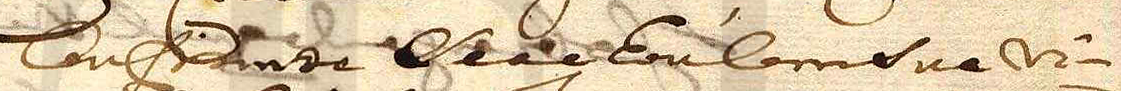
Confitente se achou com sua vi
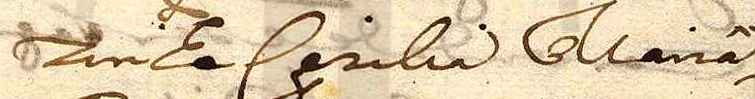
zinha Cezilia Maria
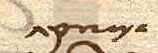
meya
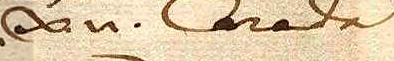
x. n. Cazada
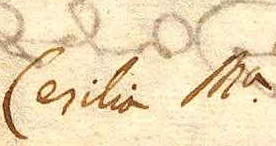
Cezilia M.a
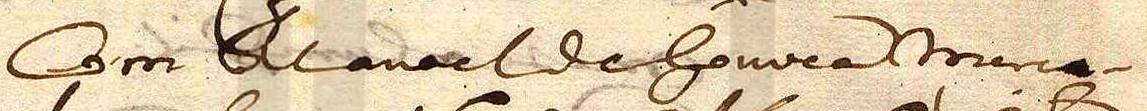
Com Manoel de Gouvea merca
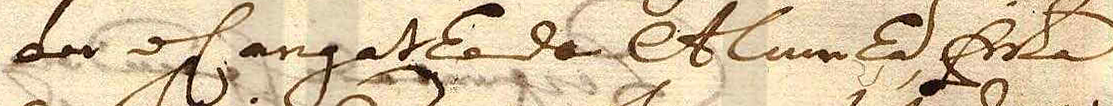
dar o Cangalho de Alcunha, filha
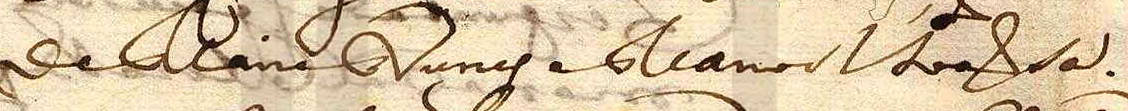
de Maria Nunes e Manoel Ioaõ sa
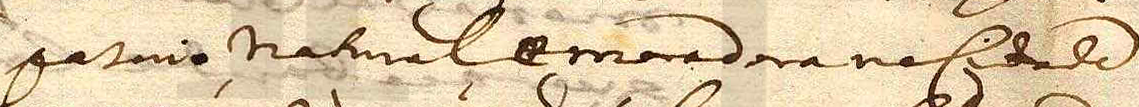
pateiro, natural, e moradora na Cidade
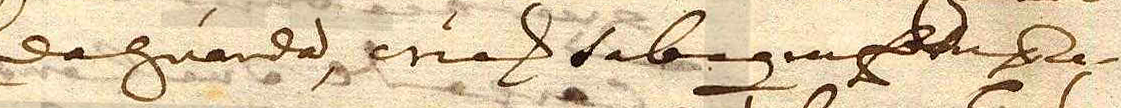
da guarda, e naõ sabe que fosse pre
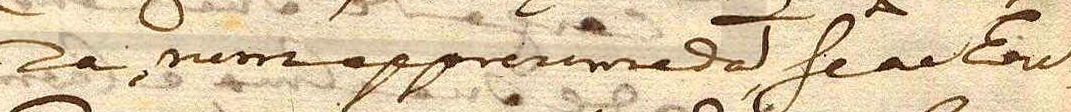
za, nem apprezentada, se achou
